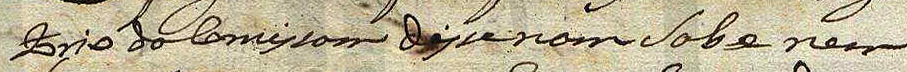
torio da Comissam disse nam sabe nem
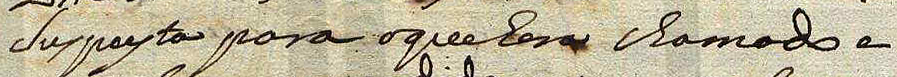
suspeyta para o que hera chamado e
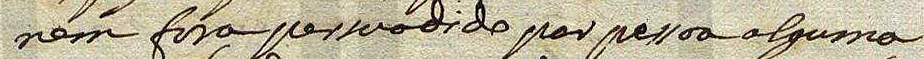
nem fora persuadido por pessoa alguma
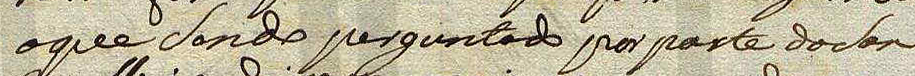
a que sendo perguntado por parte do San
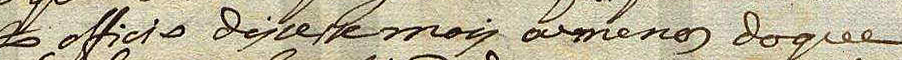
to officio discesse mais ou menos do que
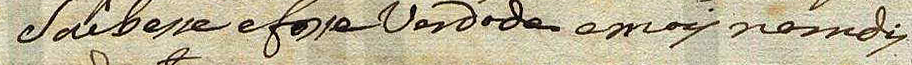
soubesse e fosse verdade e mais nam dis
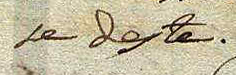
se deste.
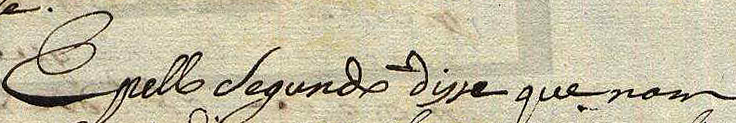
E pello Segundo disse que nam
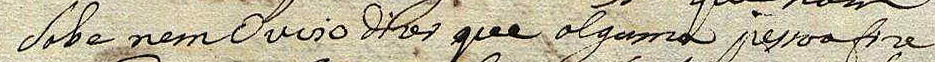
sabe nem Ouuio dizer que alguma pessoa fize
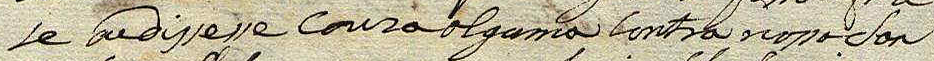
se ou dissesse couza alguma contra nossa San
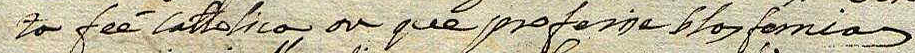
ta feé catholica ou que proferise blasfemias
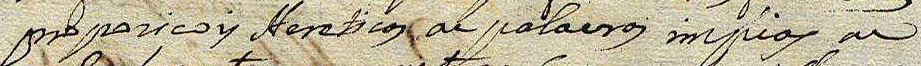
propoziçois Hereticas ou palavras impias ou
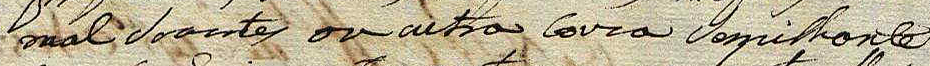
malsoantes ou outra couza semilhante
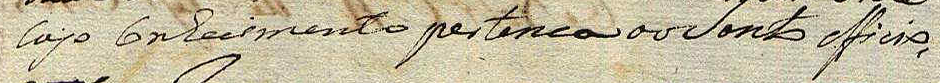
cujo conhecimento pertença ao Santo officio,
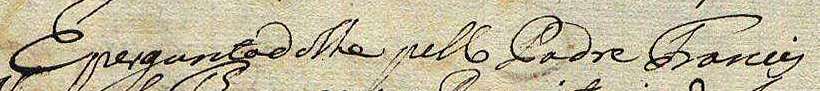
E perguntadolhe pello Padre Francis
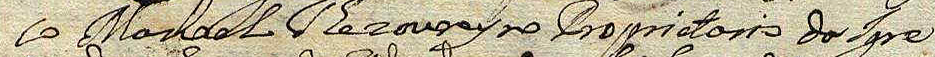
co Manoel Thezoureyro Proprietario da Igre
